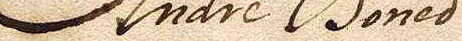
Andre Boned
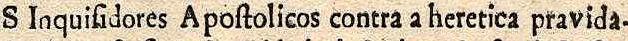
S Inquisidores Apostolicos contra a heretica pravida
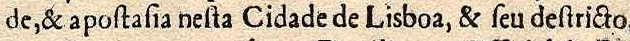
de, & apostasia nesta Cidade de Lisboa, & seu destricto,
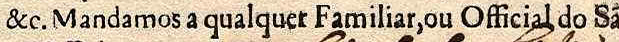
&c. Mandamos a qualquer Familiar, ou Official do Sã
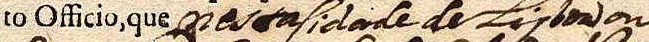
to Officio, que nesta Cidade de Lisboa, on
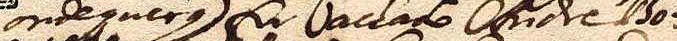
onde quer q̄ for achado Andre Bo
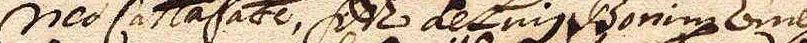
ned Callafate, filho de Luis Bonim homē
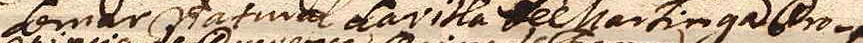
do mar natural da villa de Martinga Pro
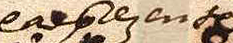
e ao pRezente
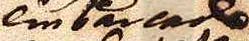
embarcado
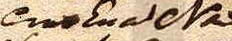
em hua Nao
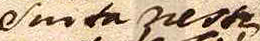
sinta neste
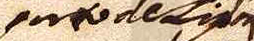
porto de Lisboa
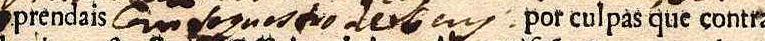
prendais com sequestro de bens: por culpas que contra
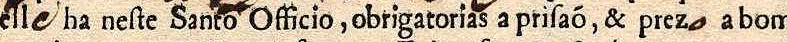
elle ha neste Santo Officio , obrigatorias a prisaõ, & prezo a bom
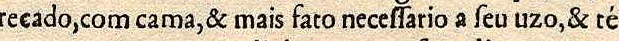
recado, com cama, & mais fato necessario a seu uzo, & té
